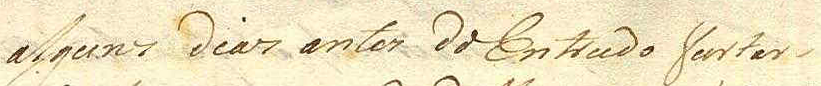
alguns dias antes do Entrudo furtar
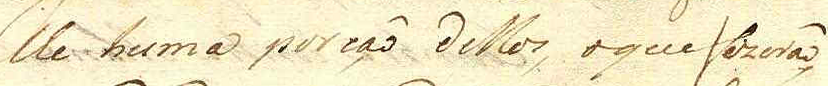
lhe huma porçaõ delles, o que fizeraõ
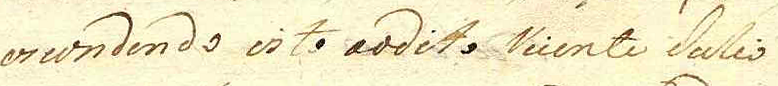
escondendo isto ao dito Vicente Iulio
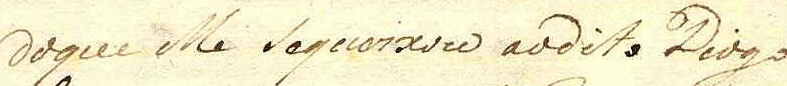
do que elle se queixou ao dito Diogo
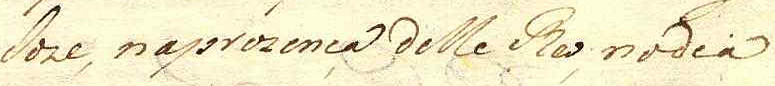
Ioze, na prezença delle Reo, no dia
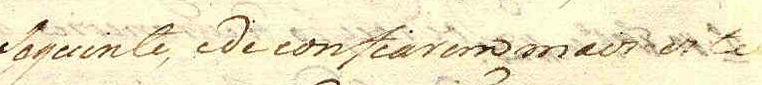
seguinte, e de confiarem mais este
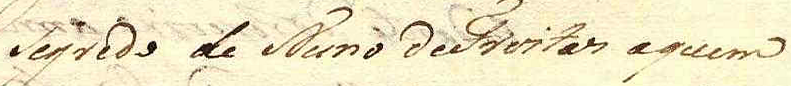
segredo de Nuno de Freitas a quem
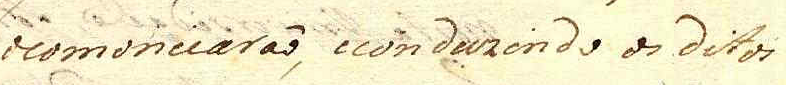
o comunicaraõ, e conduzindo os ditos
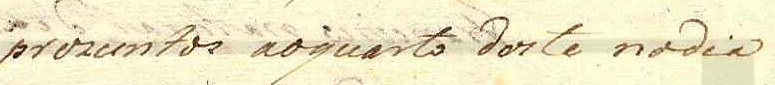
prezuntos ao quarto deste no dia
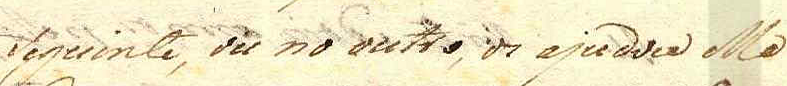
seguinte, ou no outro, os ajudou elle
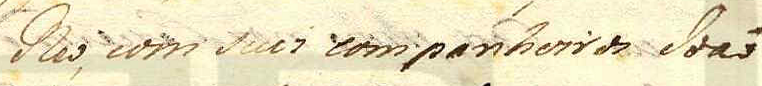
Reo, com seus companheiros Ioaõ
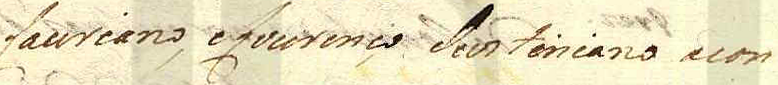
Lauriano, e Lourenço Iustiniano a con
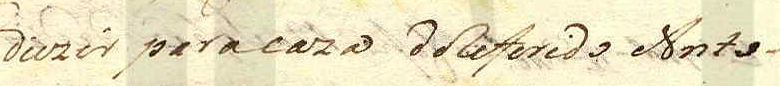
duzir para caza do Referido Anto
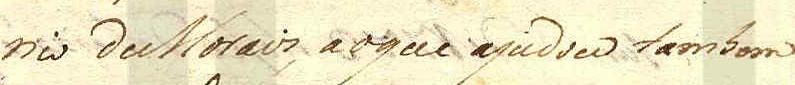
nio de Morais, ao que ajudou tambem
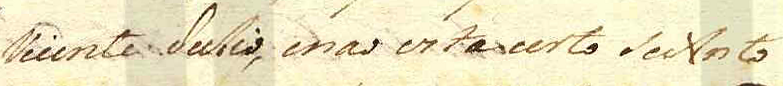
Vicente Iulio, e nao esta certo se Anto
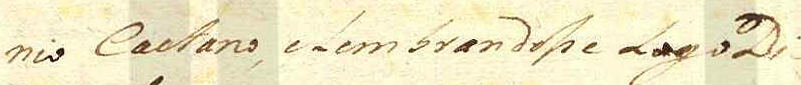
nio Caetano, e lembrandose Logo Di
